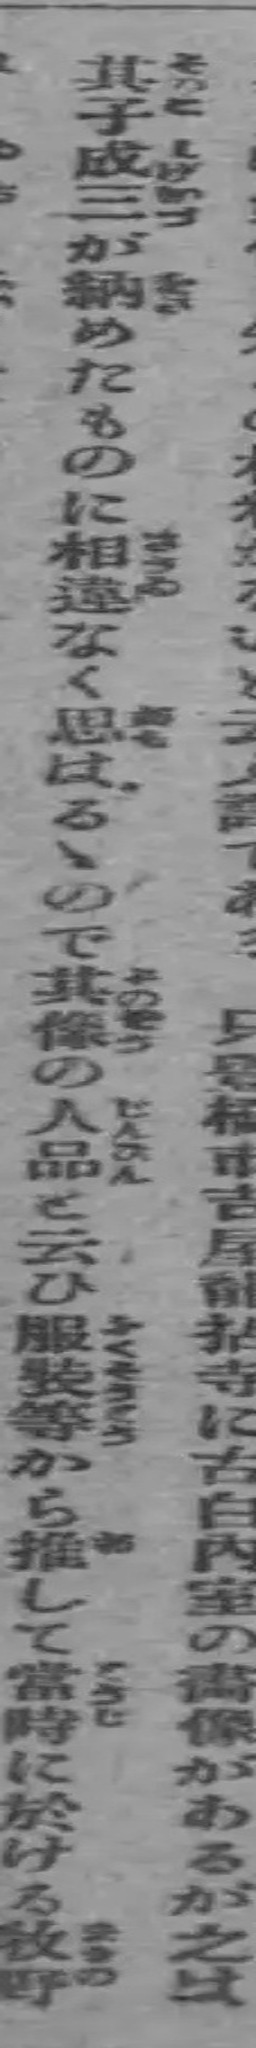其子成三が納めたものに相違なく思はるゝので其像の人品と云ひ服装等から推して当時に於ける牧野
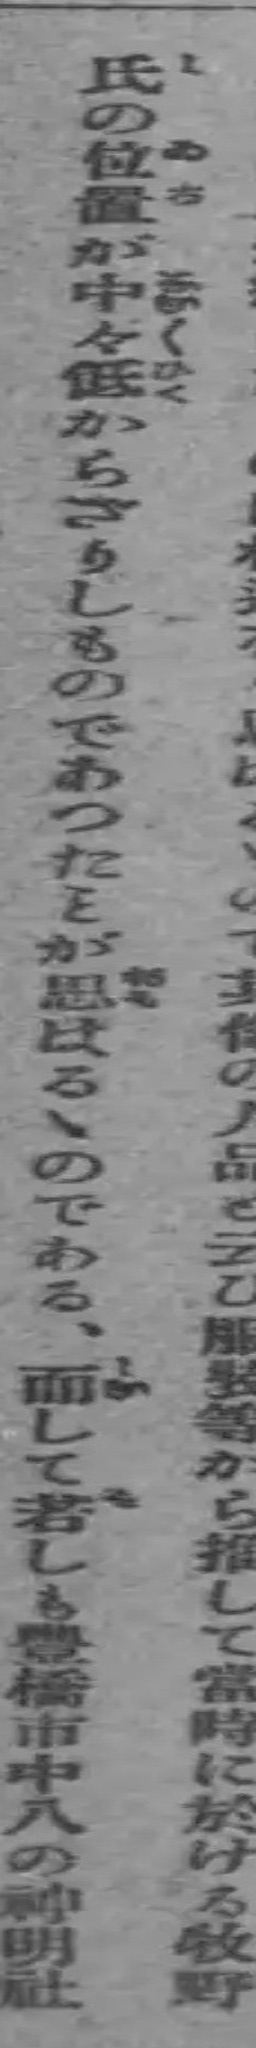氏の位置が中々低からざりしものであつたことが思はるゝのである、而して若しも豊橋市中八の神明社

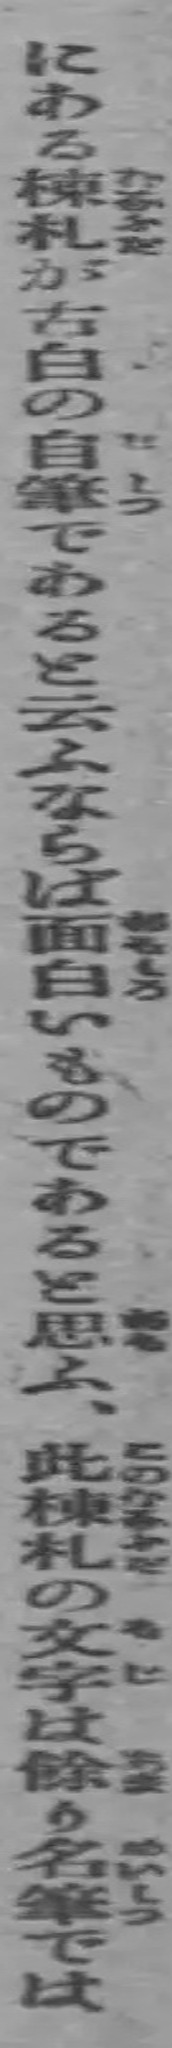にある棟札が古白の自筆であると云ふならば面白いものであると思ふ、此棟札の文字は余り名筆では
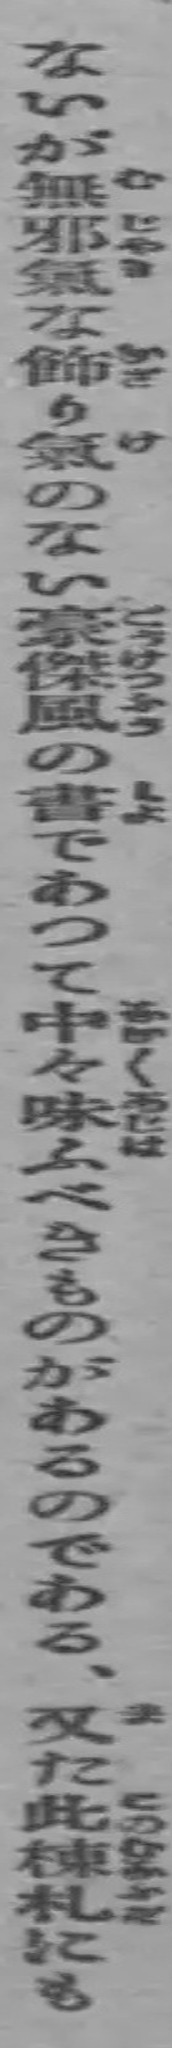ないが無邪気な飾り気のない豪傑風の書であつて中々味ふべきものがあるのである、又た此棟札にも
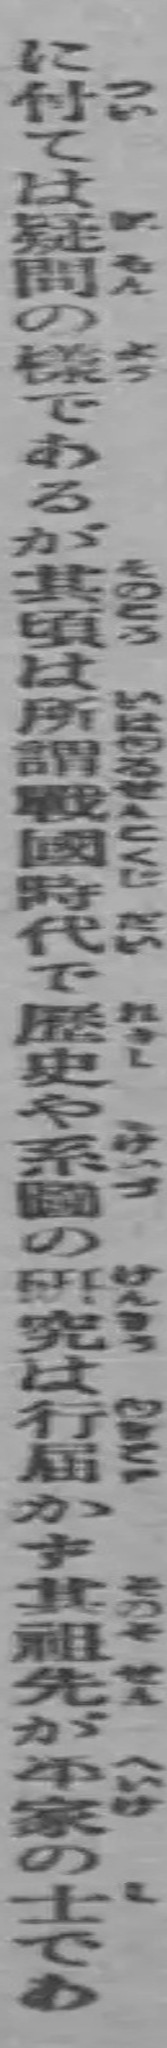に付ては疑問の様であるが其頃は所謂戦国時代で歴史や系図の研究は行届かず其祖先が平家の士であ
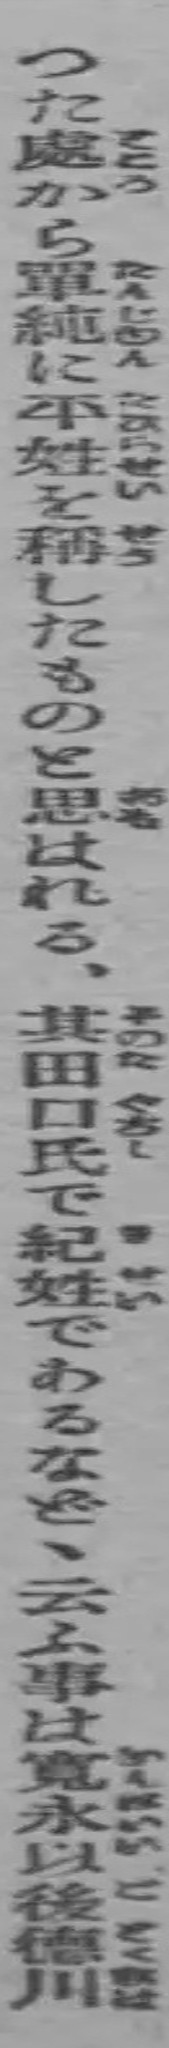つた処から単純に平姓を称したものと思はれる、其田口氏で紀姓であるなどゝ云ふ事は寛永以後徳川
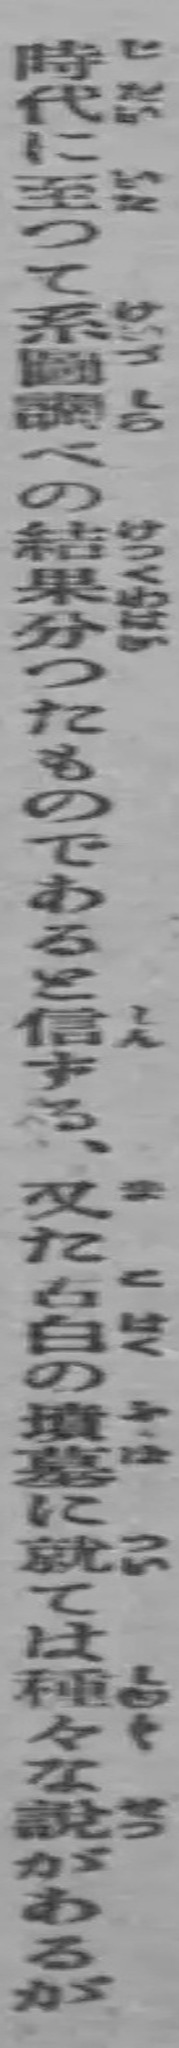古白の墳墓時代に至つて系図調べの結果分つたものであると信ずる、又た古白の墳墓に就ては種々な説があるが
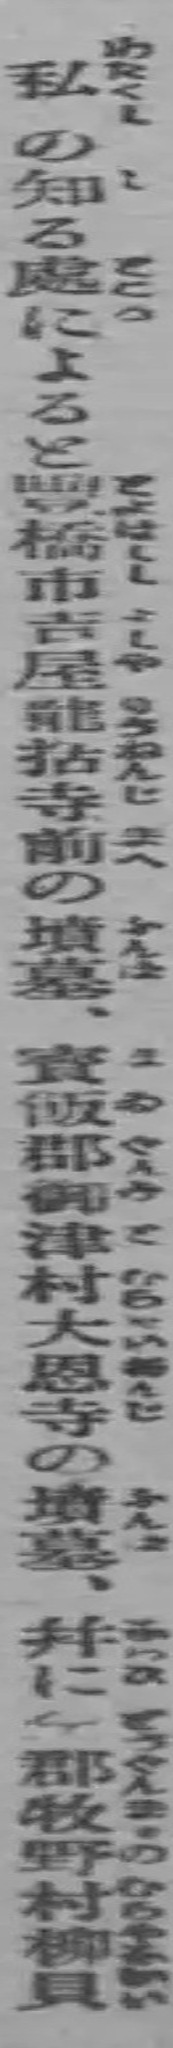私の知る処によると豊橋市吉屋龍拈寺前の墳墓、宝飯郡御津村大恩寺の墳墓、幷に仝郡牧野村柳貝
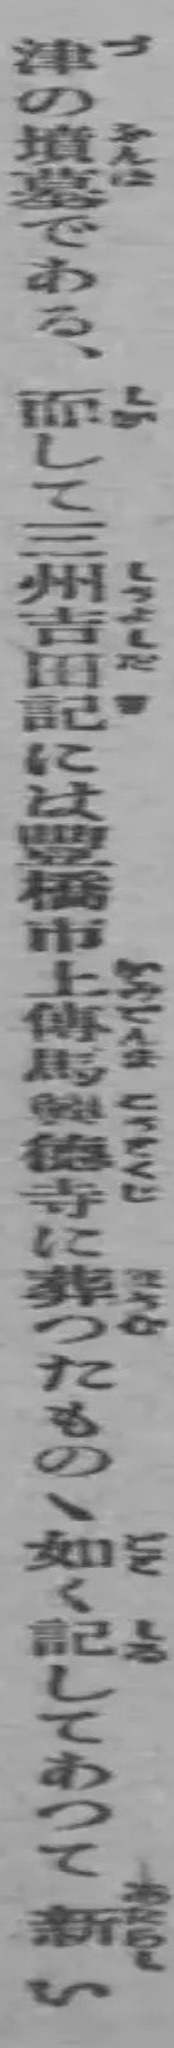津の墳墓である、而して三州吉田記には豊橋市上伝馬興徳寺に葬つたものゝ如く記してあつて新い
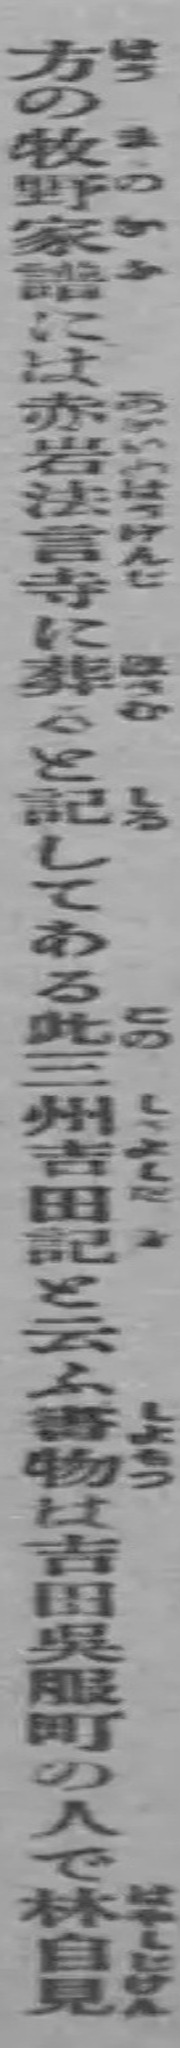方の牧野家譜には赤岩法言寺に葬ると記してある此三州吉田記と云ふ書物は吉田呉服町の人で林自見
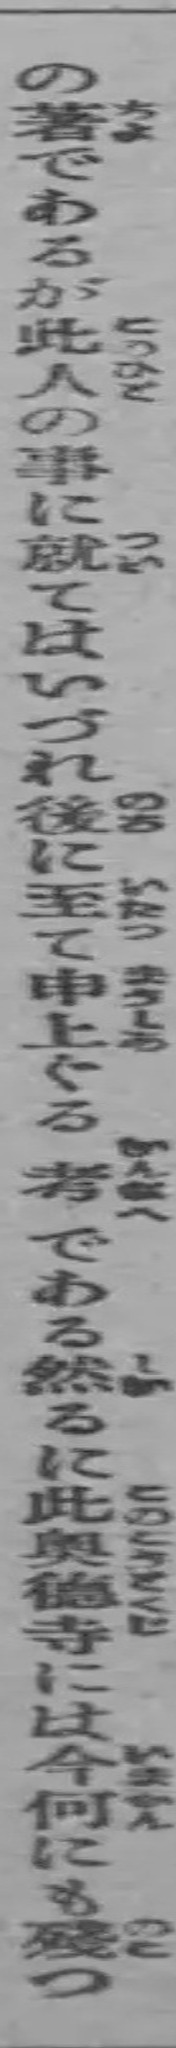の著であるが此人の事に就てはいづれ後に至て申上ぐる考である然るに此興徳寺には今何にも残つ
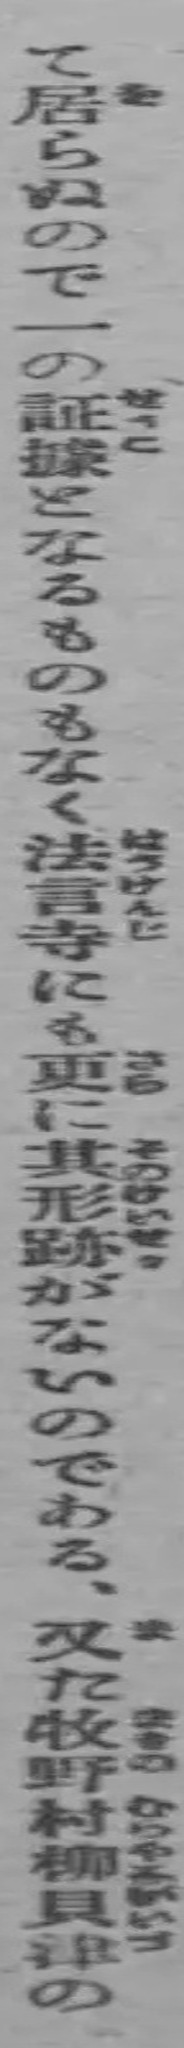て居らぬので一の証拠となるものもなく法言寺にも更に其形跡がないのである、又た牧野村柳貝津の
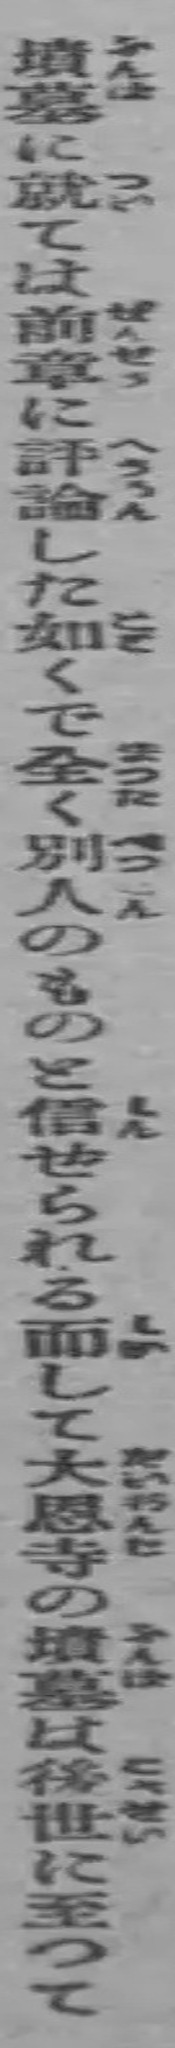墳墓に就ては前章に評論した如くで全く別人のものと信ぜられる而して大恩寺の墳墓は後世に至つて
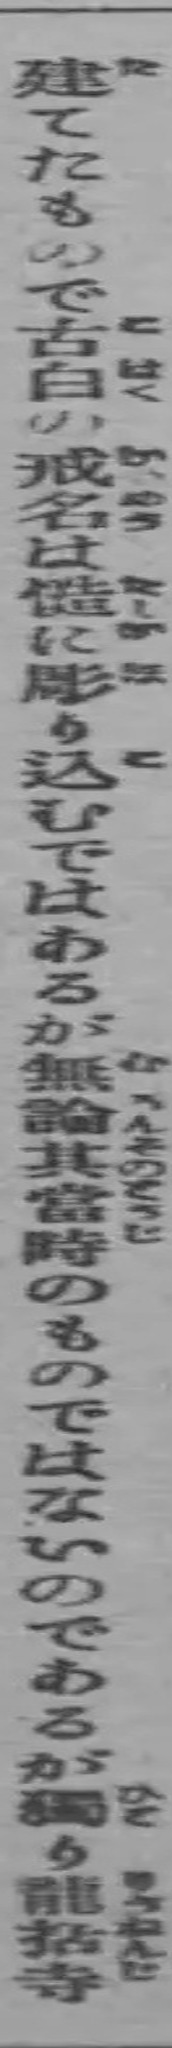建てたもので古白の戒名は慥に彫り込むではあるが無論当時のものではないのであるが独り龍拈寺
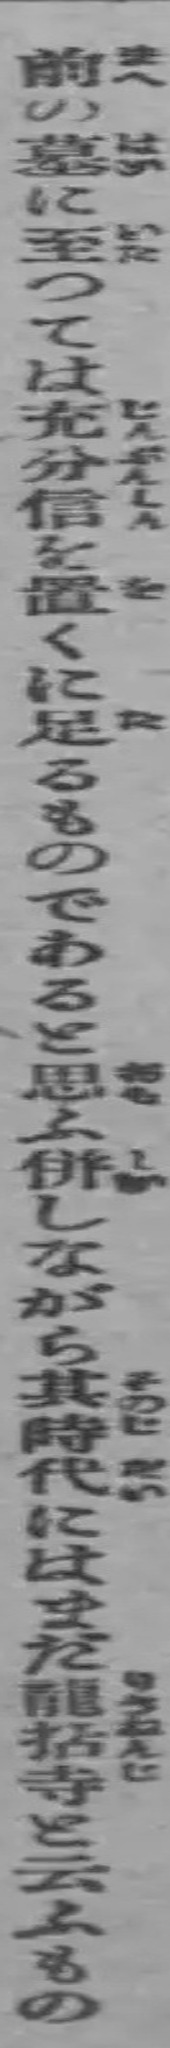前の墓に至つては充分信を置くに足るものであると思ふ併しながら其時代にはまだ龍拈寺と云ふもの
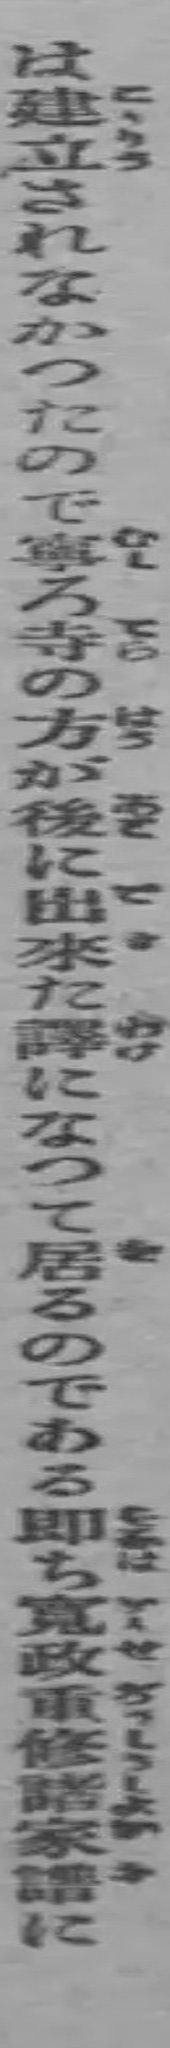は建立されなかつたので寧ろ寺の方が後に出来た訳になつて居るのである即ち寛政重修諸家譜に
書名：豊橋市史談
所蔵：国立国会図書館 National Diet Library, JAPAN
